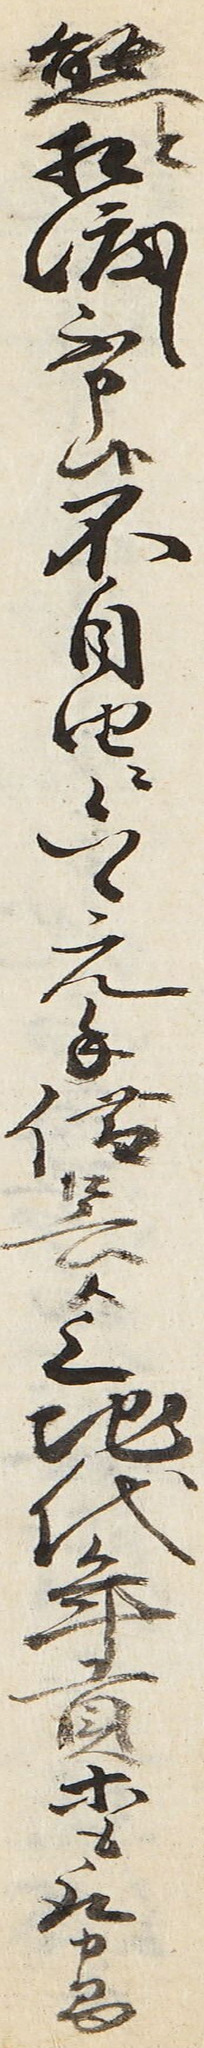態と相渡し不申候不自由に候はゝ元手借呉上地代年貢等も取申間
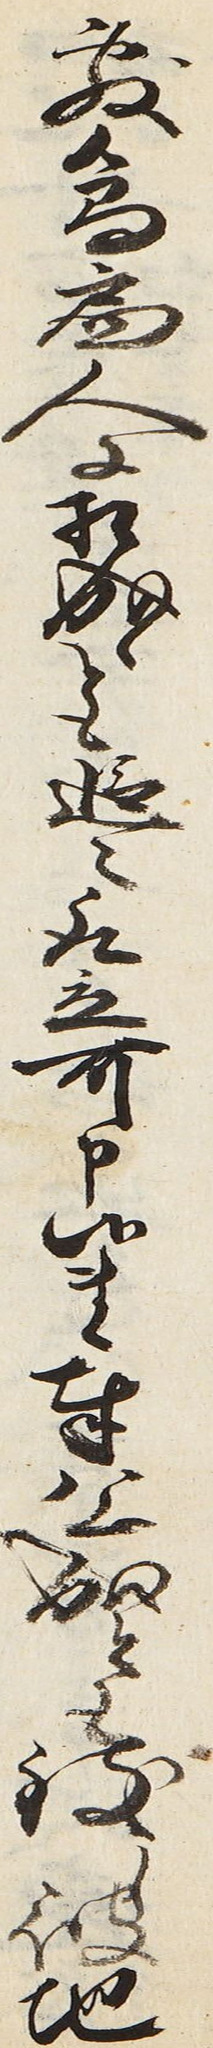敷候間商人に相成候とも追々取立可申候まゝ奉公成とも致し彼地
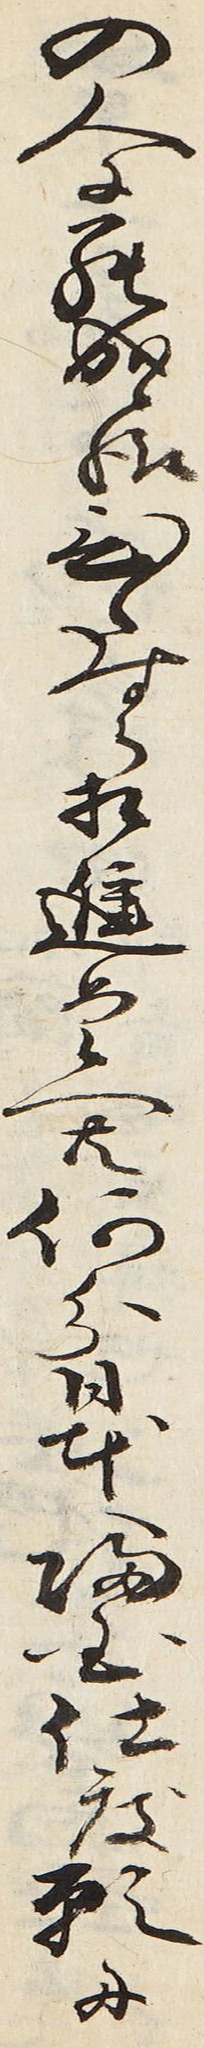の人に罷成候様ひたすら相進め候へ共何分日本へ帰国仕度願に
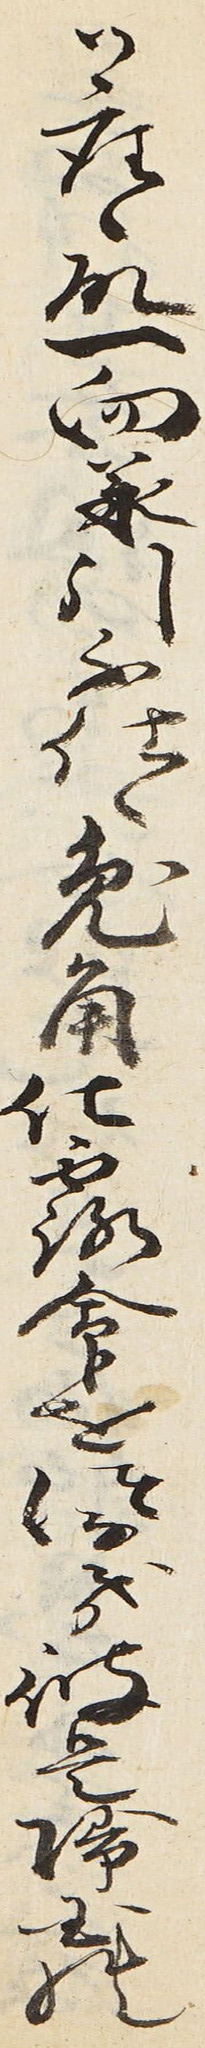御座候故一向承引不仕候兎角仕露命をつなき彼是帰国の
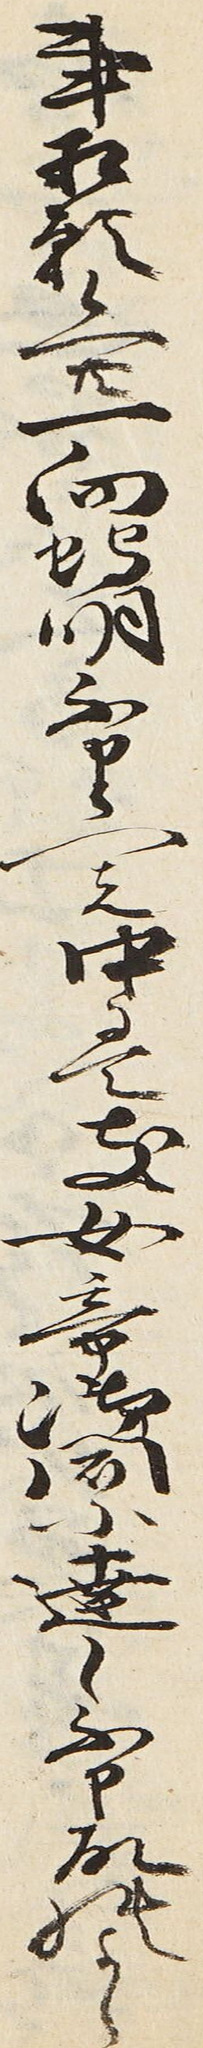事相願候へ共一向埒明不申候へは中にて支女帝御問に達し不申
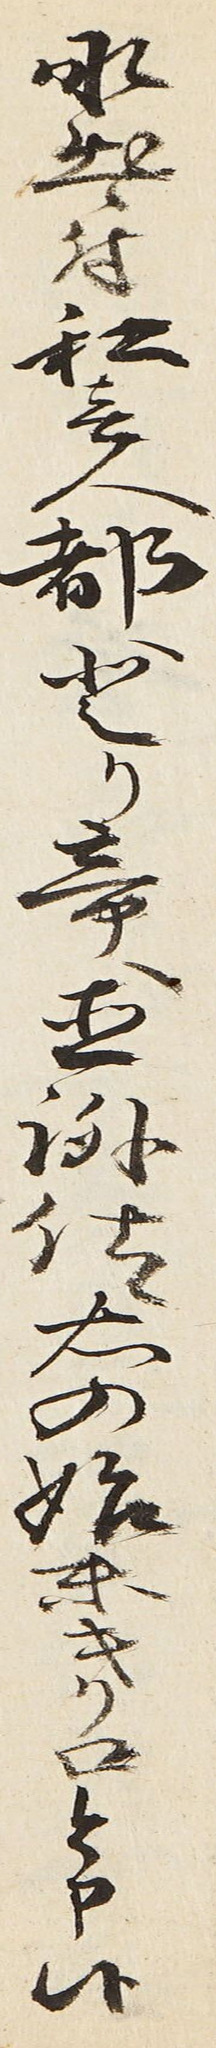承出候付私壱人都へ登り帝へ直訴仕候右の始末キリロと申候
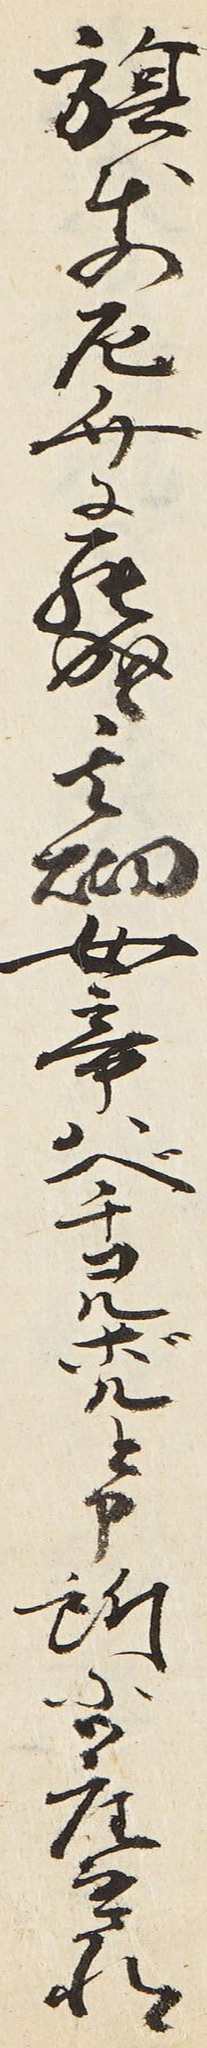旗本の厄介に罷成候其砌女帝はベチコルボルと申所に御座なされ候
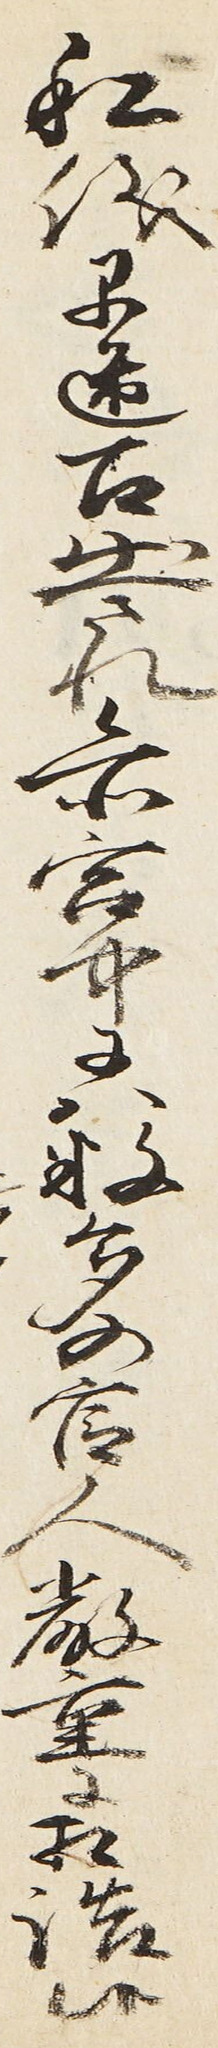私儀早速右出され候所宮中には数多くの宦人厳重に相詰候
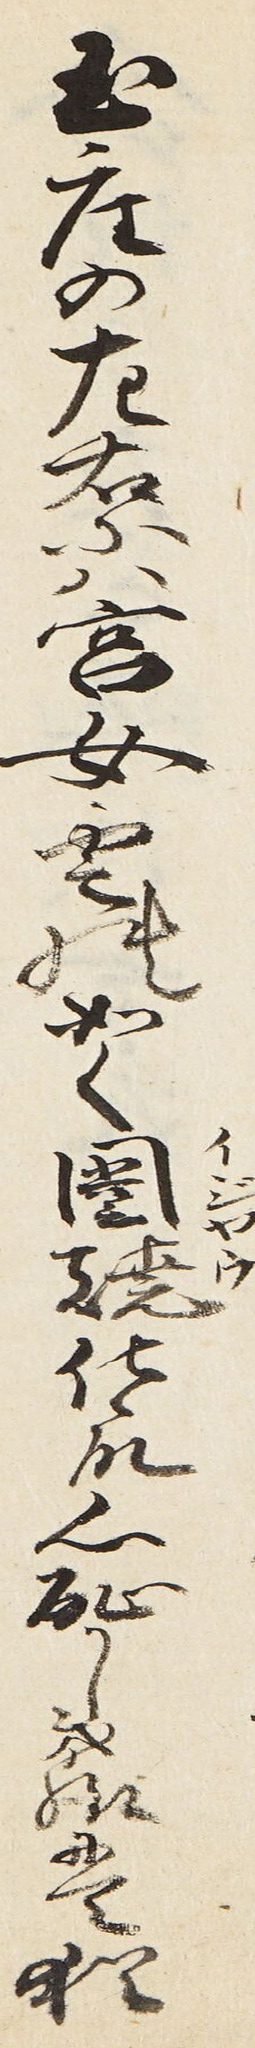玉座の左右には宮女雲の如く囲繞仕候故心配しき様にて猶
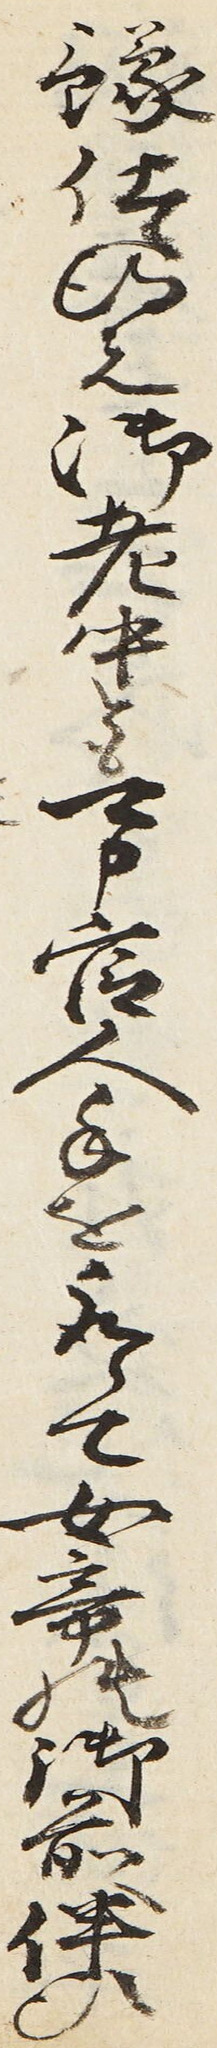予仕候得は御老中とも可申宦人手を取候て女帝の御前へ伴ひ
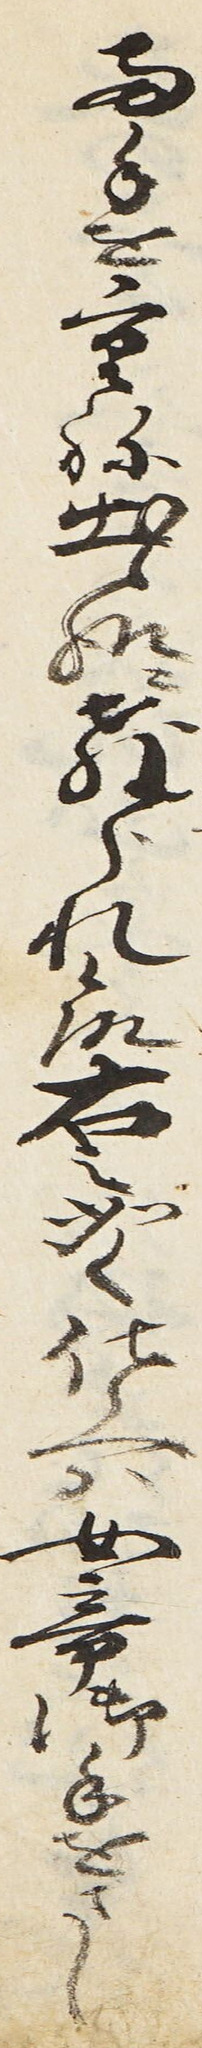両手を重ね出候処に教られ候故右之如く仕候へは女帝御手をさし
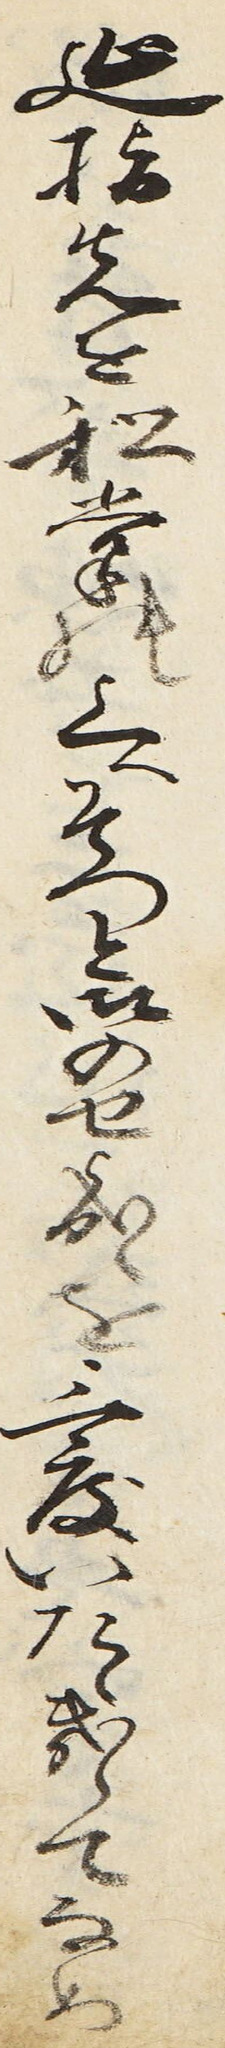延指先を私掌の上へそつと御のせ被成候を三度いたゝき候てなめ
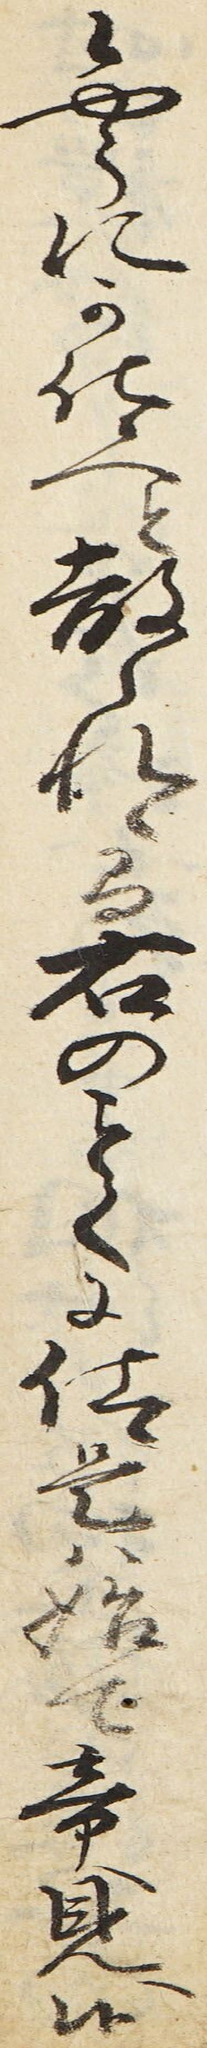るやうに可仕候へと教られ候間右のことくに仕候是は始て帝へ見へ候

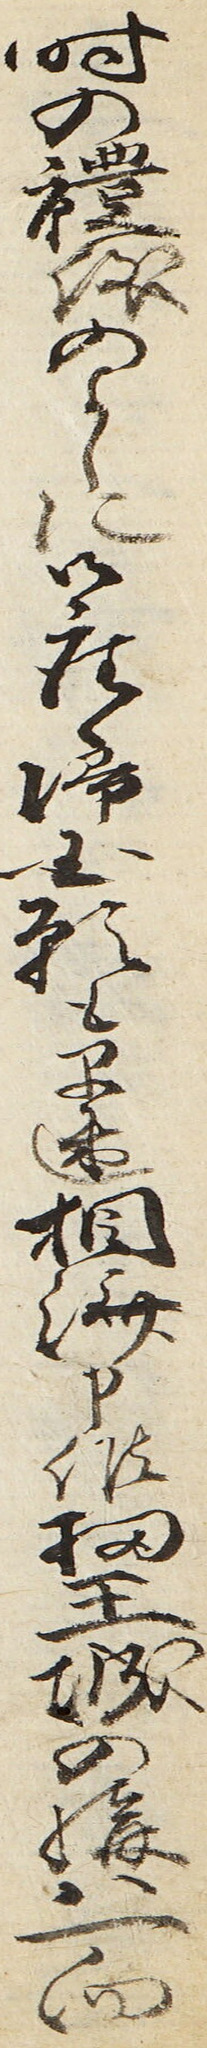時の礼儀のよしに御座候帰国願も早速相済申候扨王城の構は一向
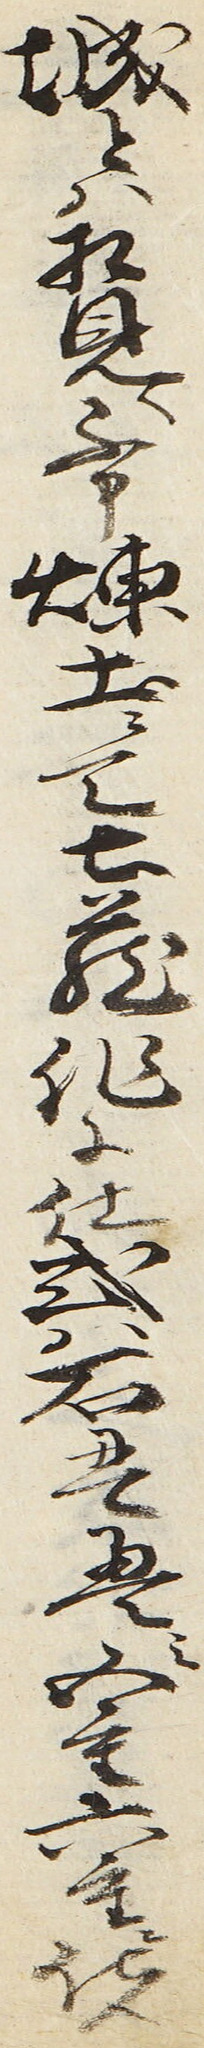城とは相見へ不申煉土にて土蔵作に仕或は石にて畳み五重六重に仕候
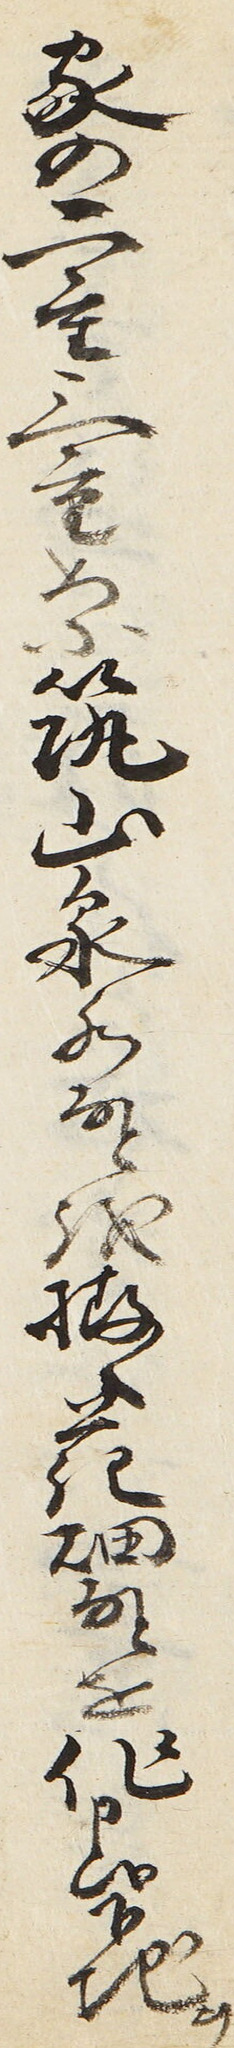家の二重三重めに築山泉水なとを拵ふ花畑なとを作申候下地を
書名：漂民御覧之記
